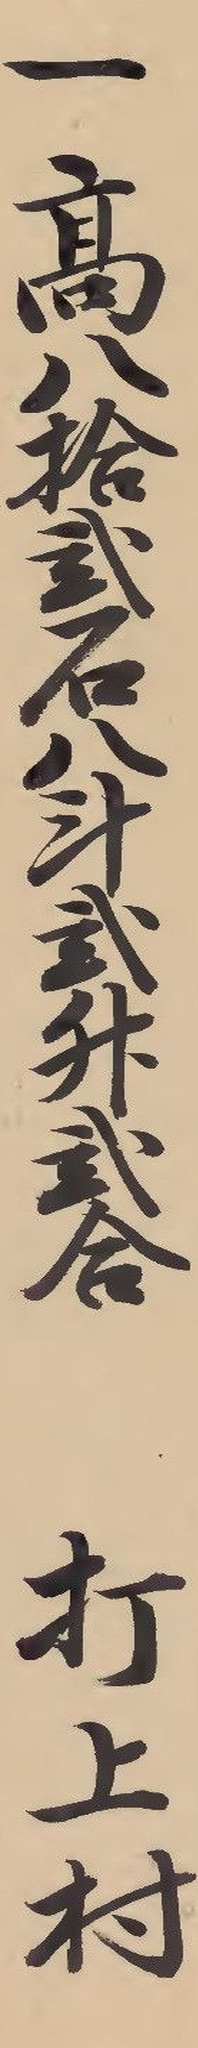一高八拾弐石八斗弐升弐合打上村
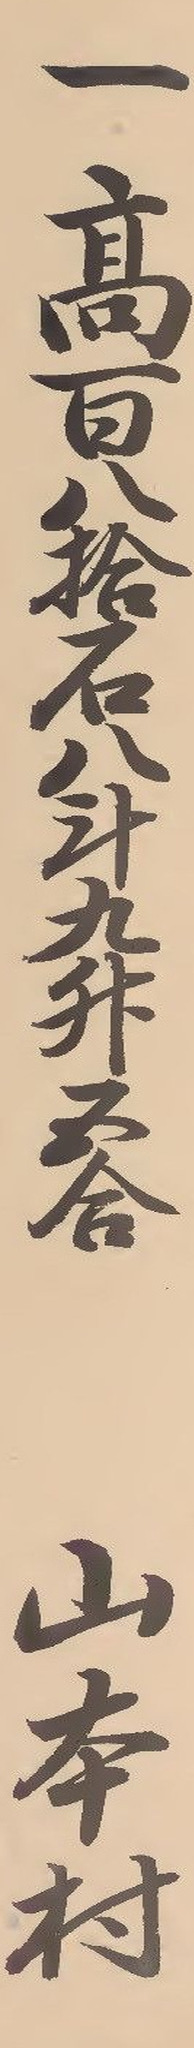一高百八拾石八斗九升五合山本村
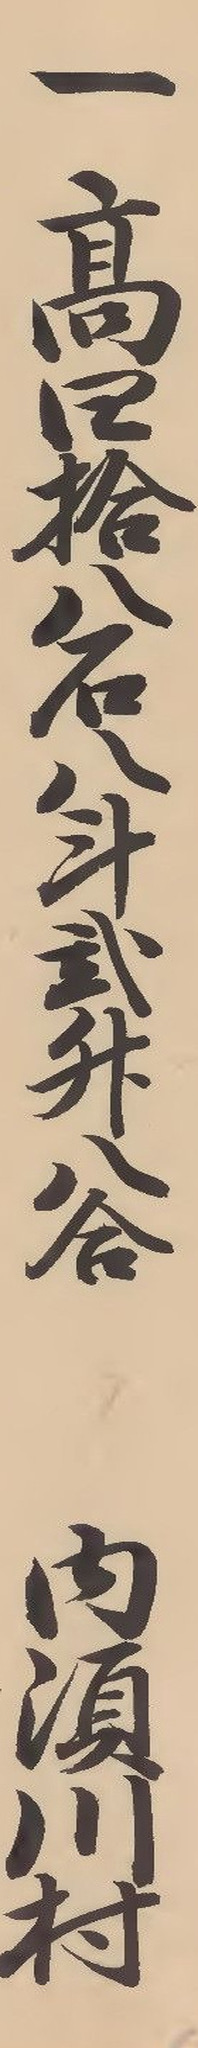一高四拾八石八斗弐升八合内須川村
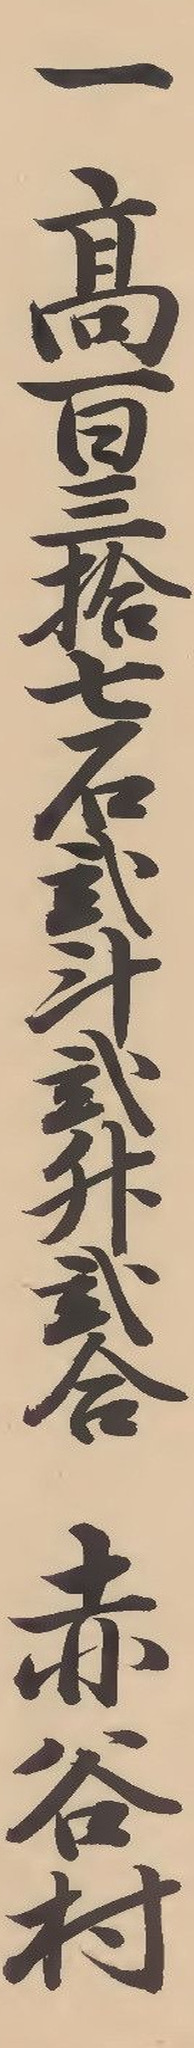一高百三拾七石弐斗弐升弐合赤谷村
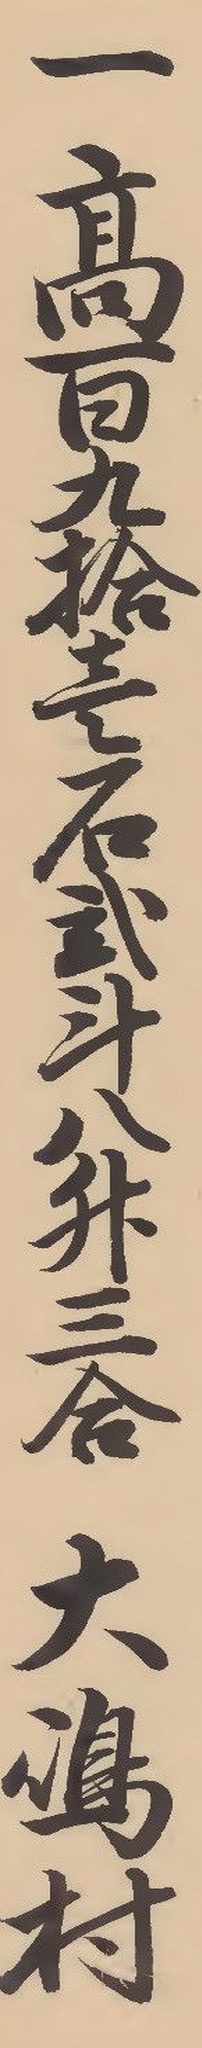一高百九拾壱石弐斗八升三合大島村

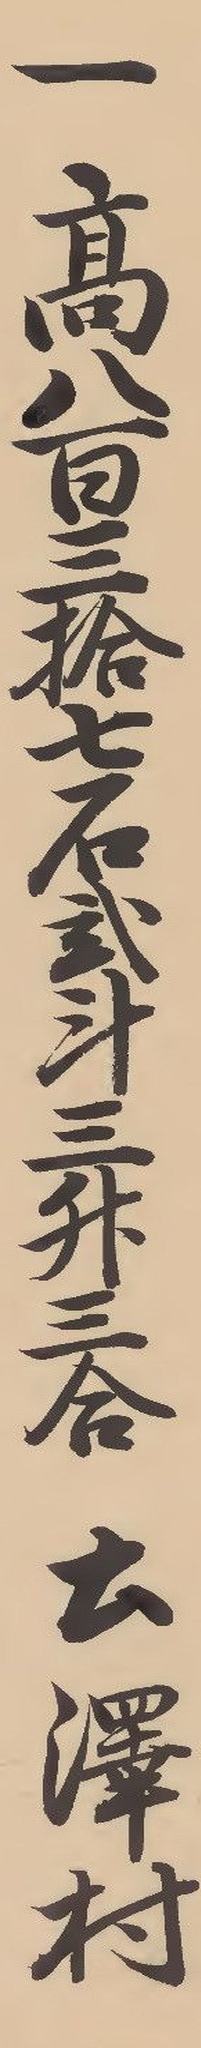一高八百三拾七石弐斗三升三合土沢村
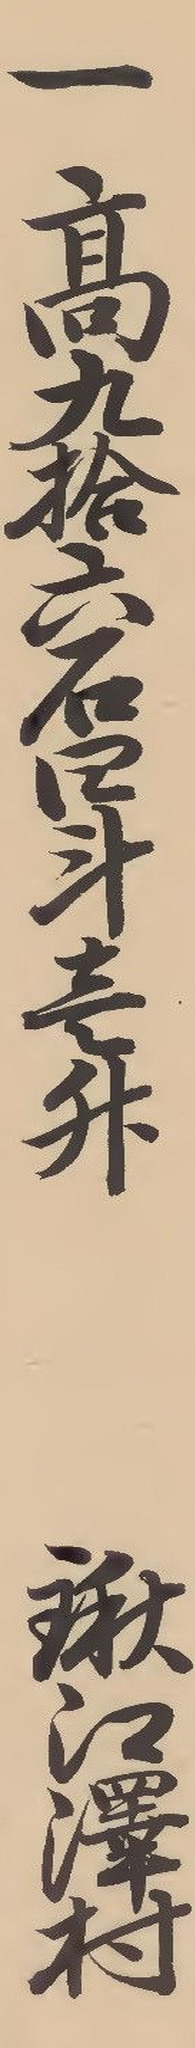一高九拾六石四斗壱升鍬江沢村
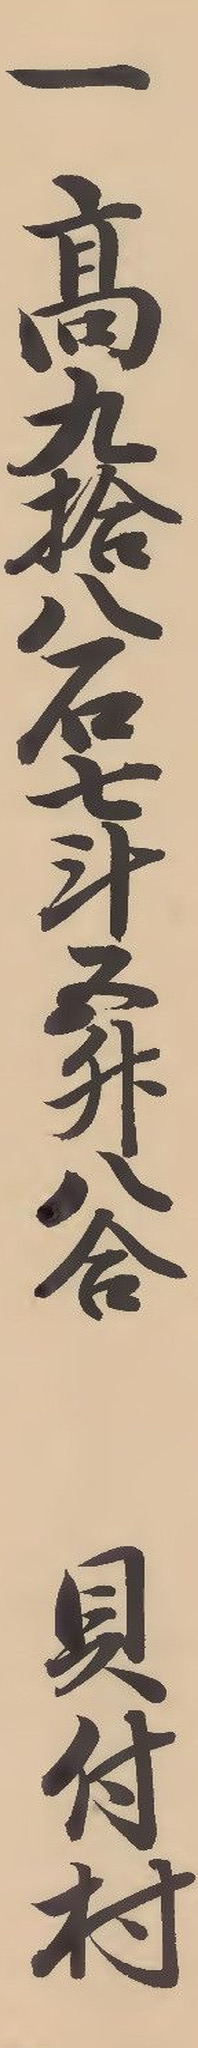一高九拾八石七斗五升八合貝付村
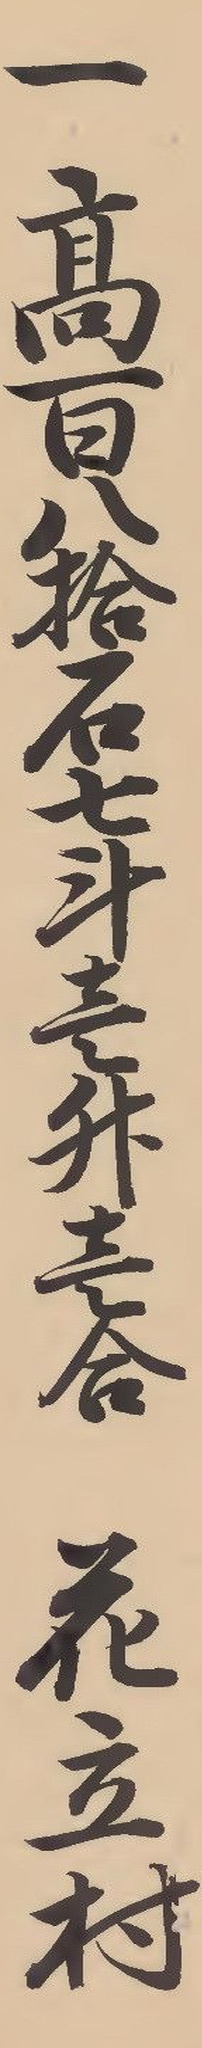一高百八拾石七斗壱升壱合花立村
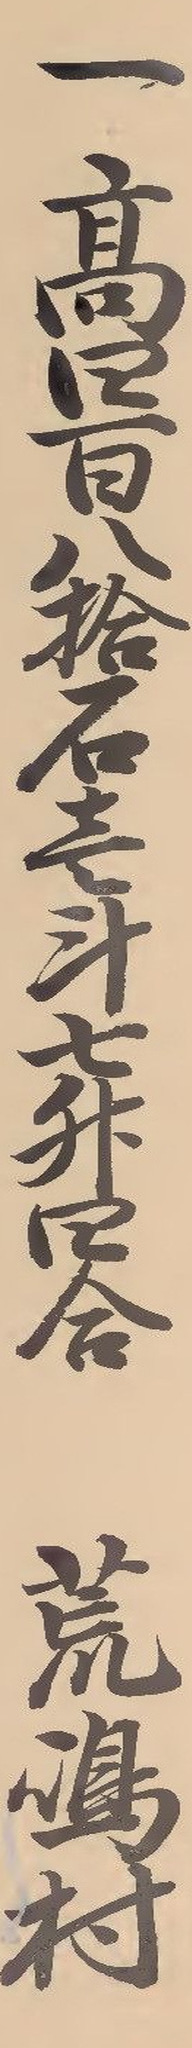一高四百八拾石壱斗七升四合荒島村
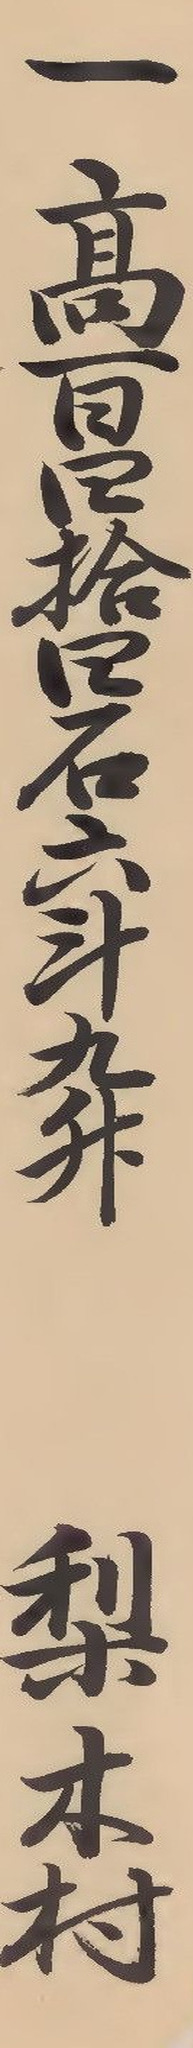一高百四拾四石六斗九升梨木村
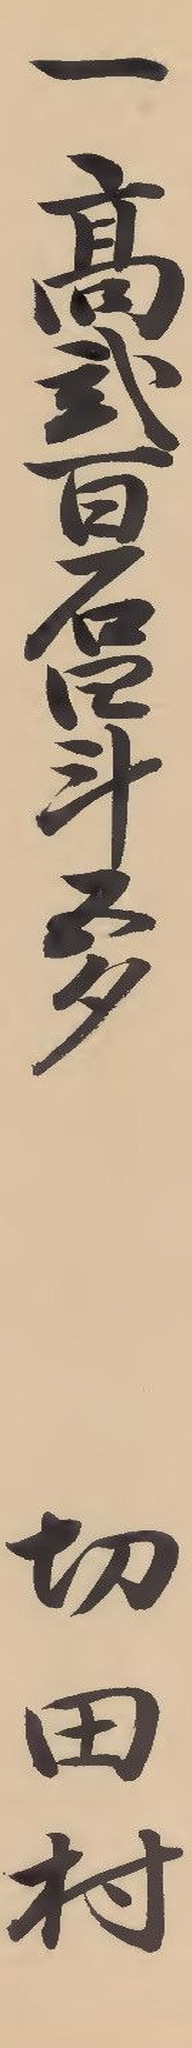一高弐百石四斗五勺切田村
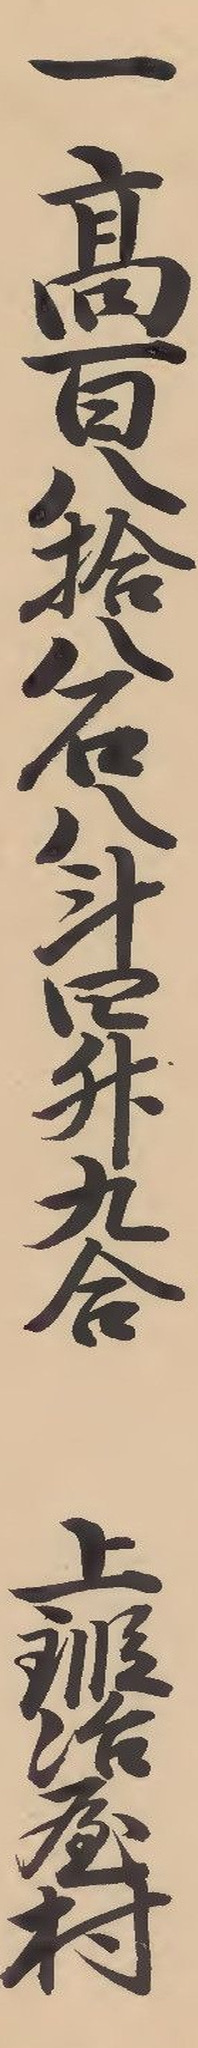一高百八拾八石八斗四升九合上鍛冶屋村

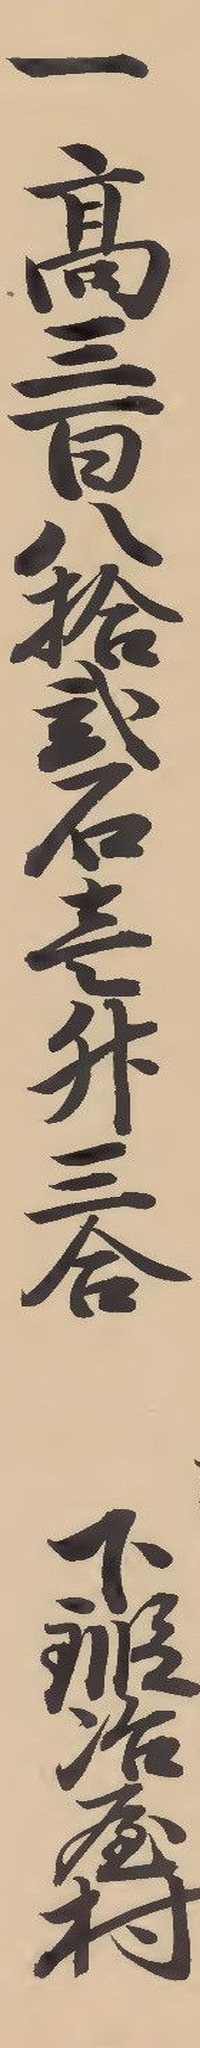一高三百八拾弐石壱升三合下鍛冶屋村
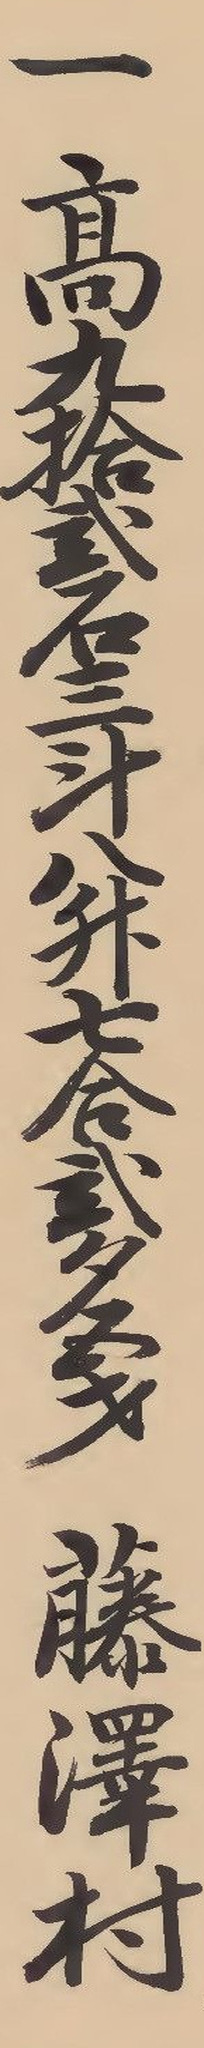一高九拾弐石三斗八升七合弐勺五才藤沢村
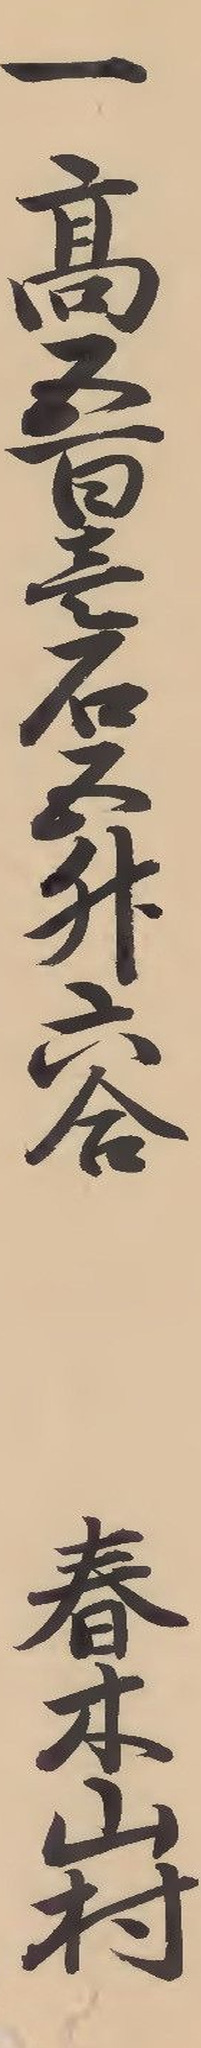一高五百壱石五升六合春木山村
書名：越後国郷帳　下
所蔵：国立公文書館 National Archives of Japan
